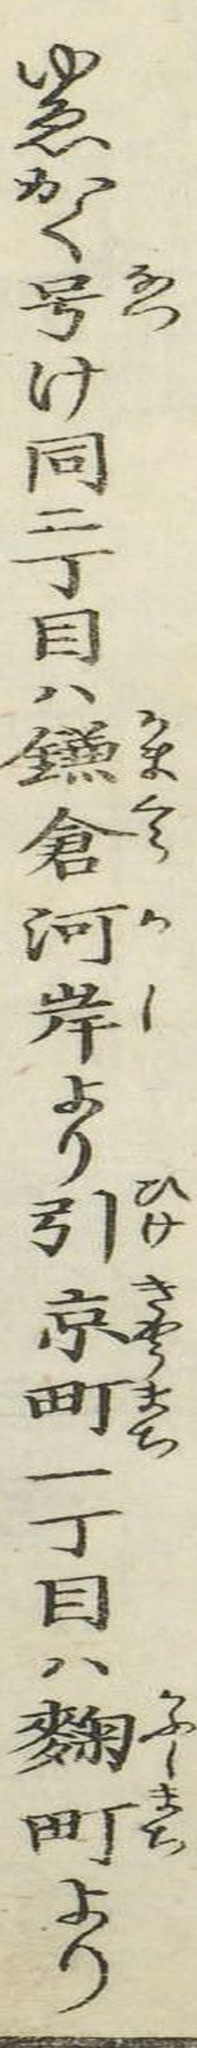ゆゑかく号け同二丁目は鎌倉河岸より引京町一丁目は麴町より
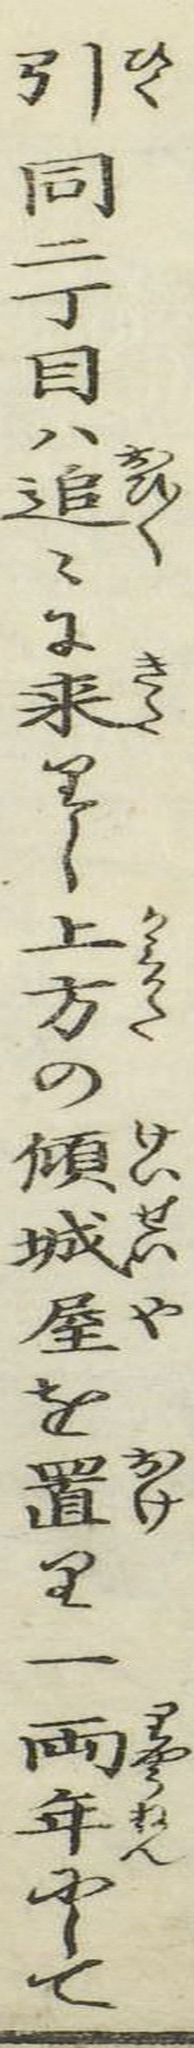引同二丁目は追々に来りし上方の傾城屋を置り一両年にして
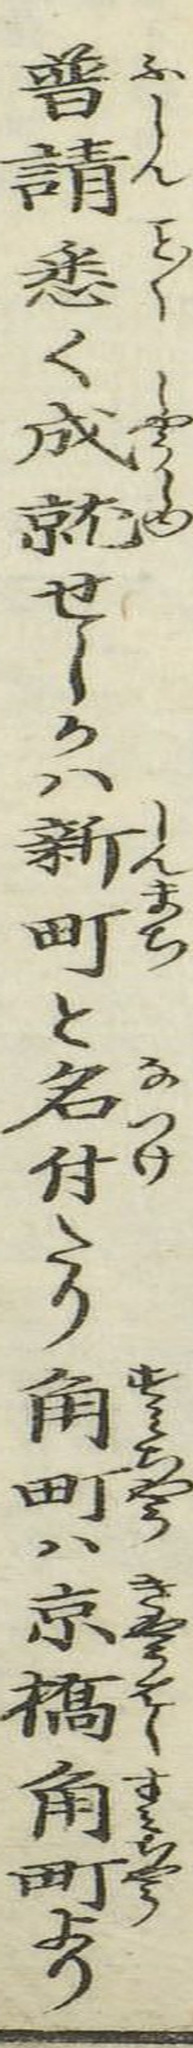普請悉く成就せしかは新町と名付たり角町は京橋角町より
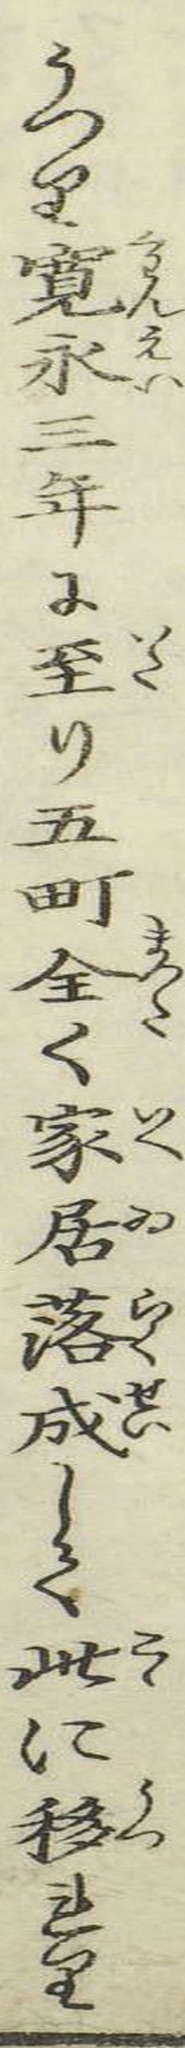うつり寛永三年に至り五町全く家居落成して此に移れり
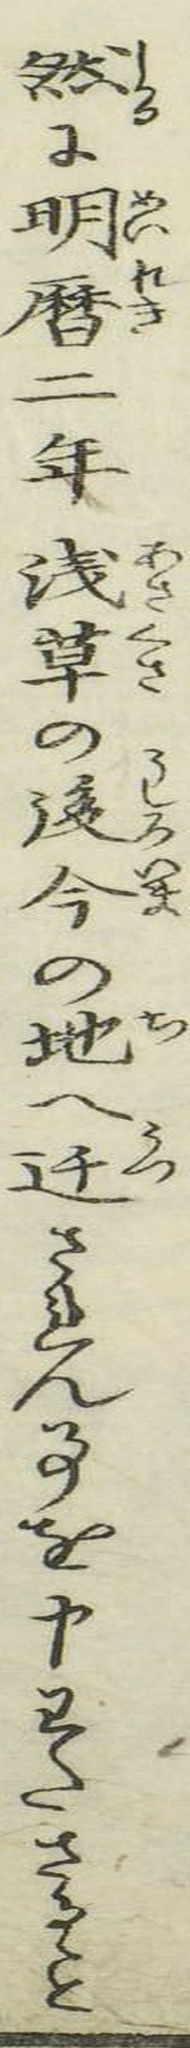然に明暦二年浅草の後今の地へ遷されん事を申わたさるゝと
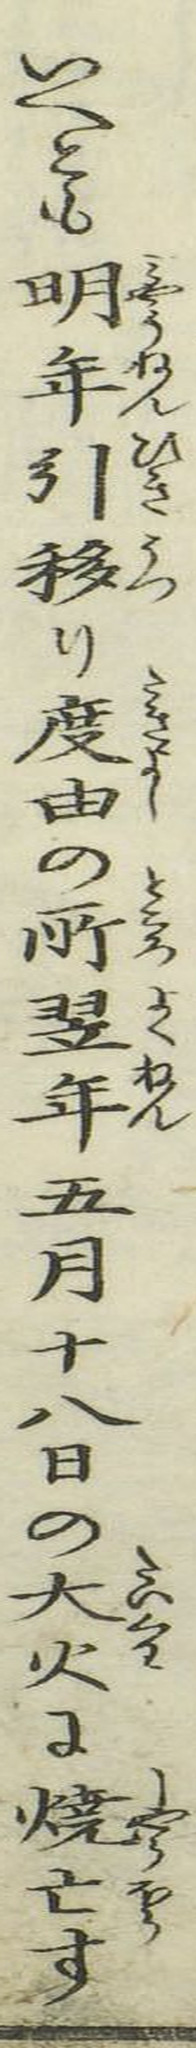いへとも明年引移り度由の所翌年五月十八日の大火に焼亡す
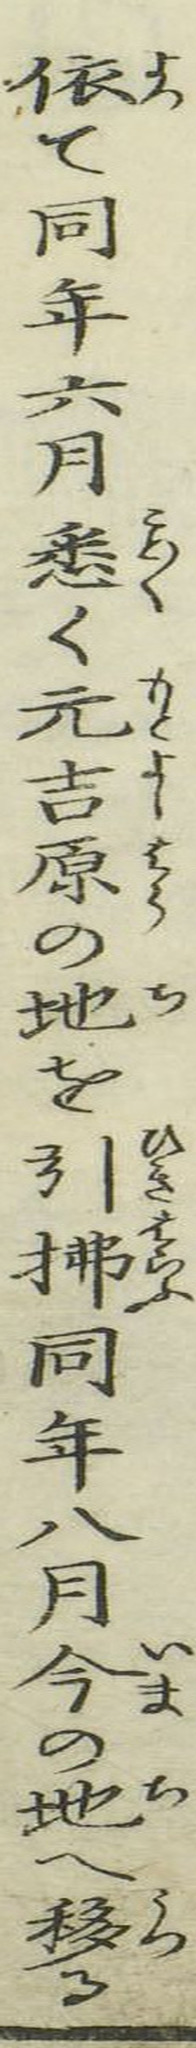依て同年六月悉く元吉原の地を引拂同年八月今の地へ移る

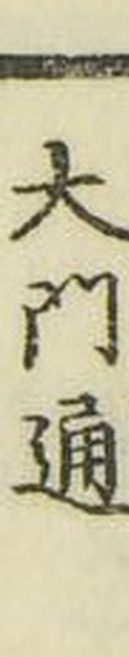大門通
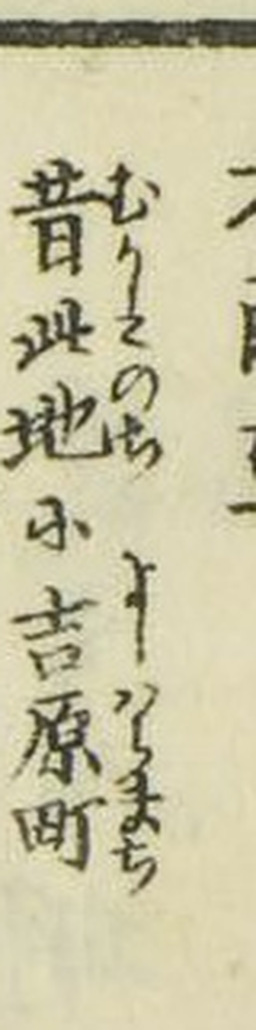昔此地に吉原町
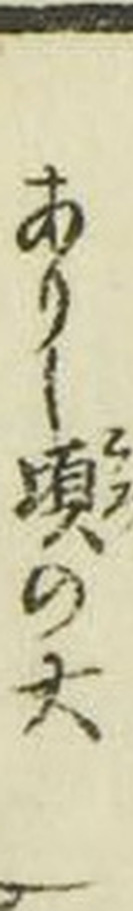ありし頃の大
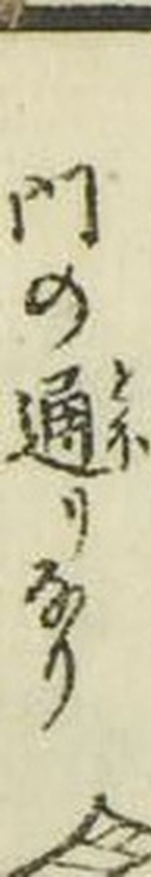門の通りなり
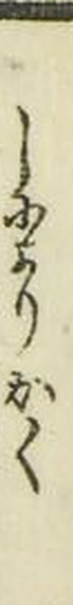しによりかく
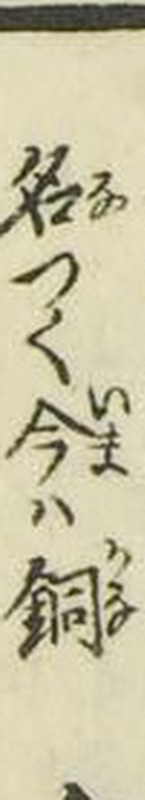名つく今は銅
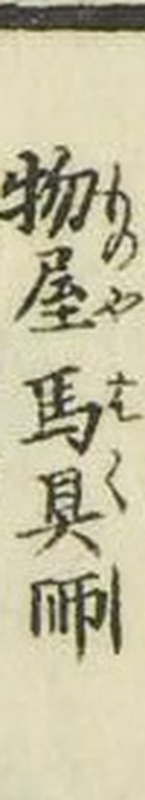物屋馬具師
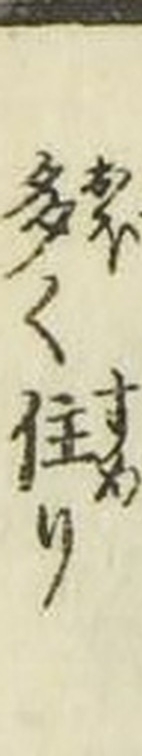多く住り
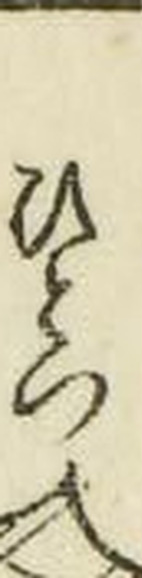ひとつ
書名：江戸名所図会 20巻 巻之2
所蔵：東京学芸大学教育コンテンツアーカイブ
